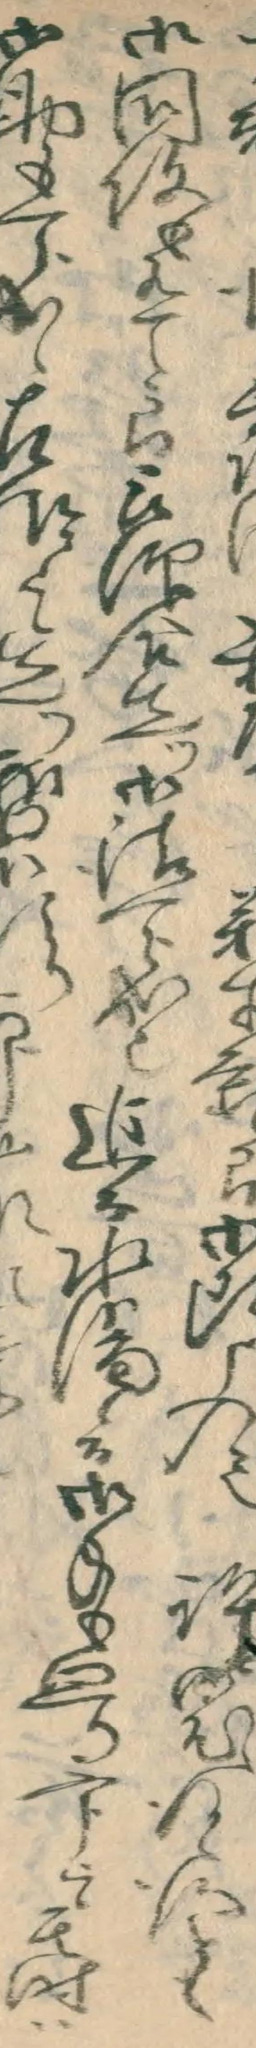御同役も有之候間被仰合先ツ御請可被成也追而水候而御手も廻り不申候ハヽ其時ハ
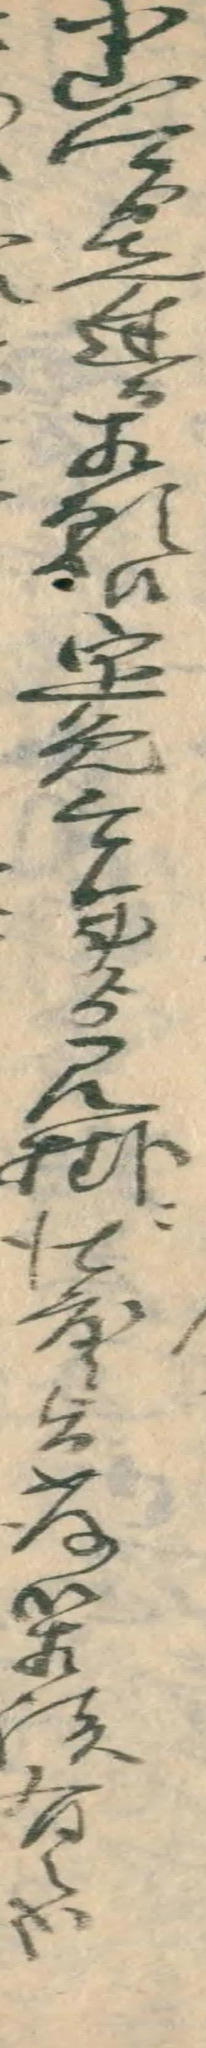一小山郷ゟ先達而相願候定免今年ゟ見掛ニ仕度候旨如何御相談有之哉
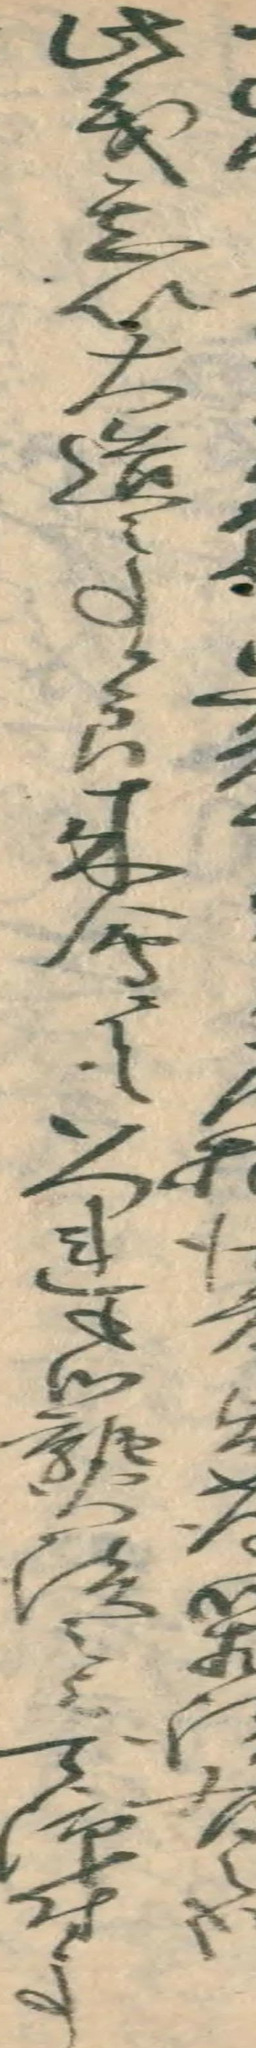此義甚以大造之事ニ候間来会ニてもいつれも御熟談之上可被仰付候事
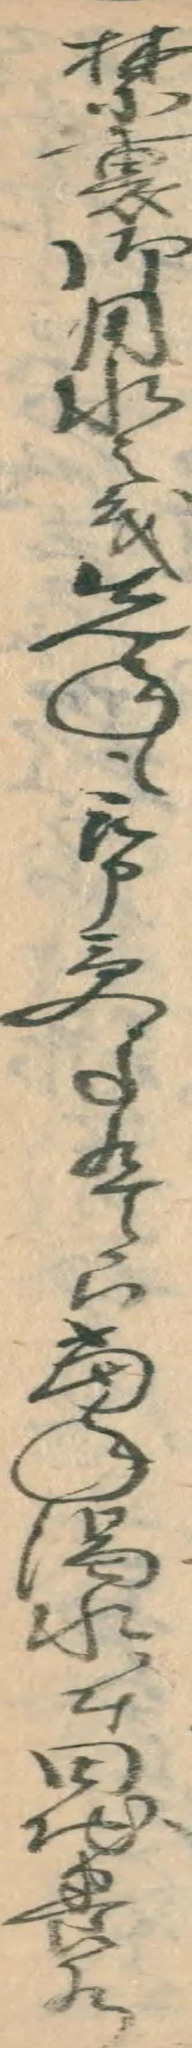一禁裏御用水之義先年も被申受事有之間当年渇水ニ付田地養水

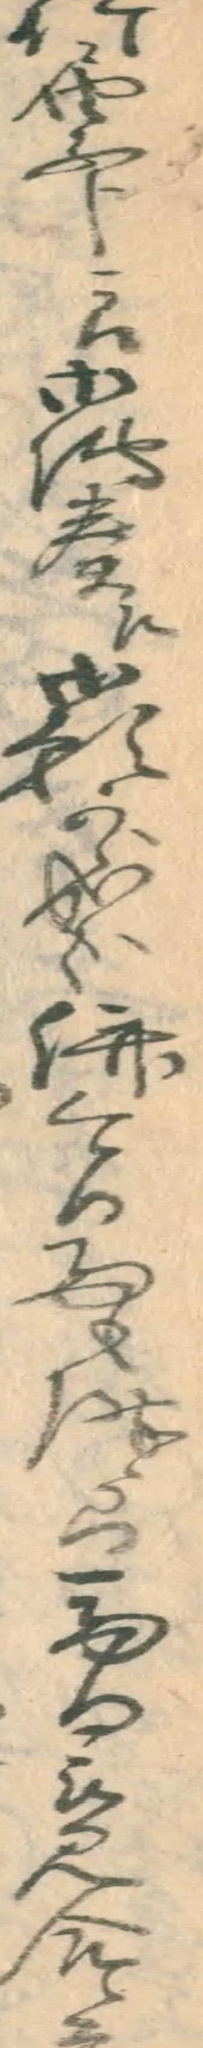行届不申候間御伝奏江御願可被成哉併今日雨も降候間一両日被見合候而
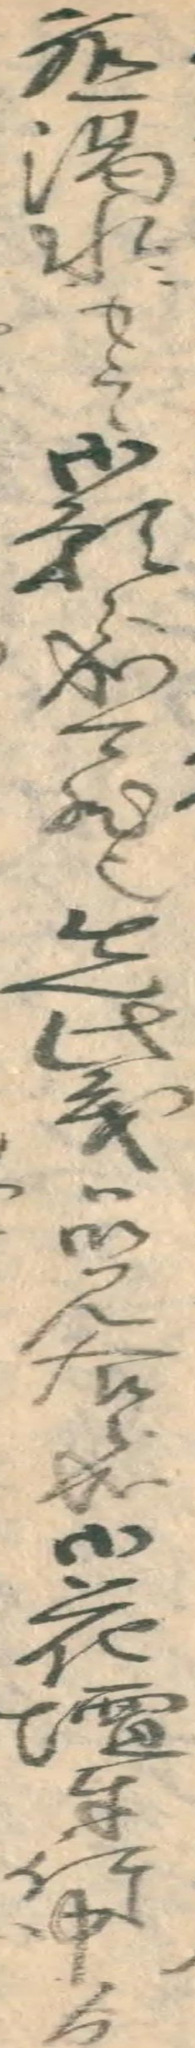愈渇水ニも候ハヽ御願被成可然也先此義ハ御見合被成御花壇奉行中ゟ
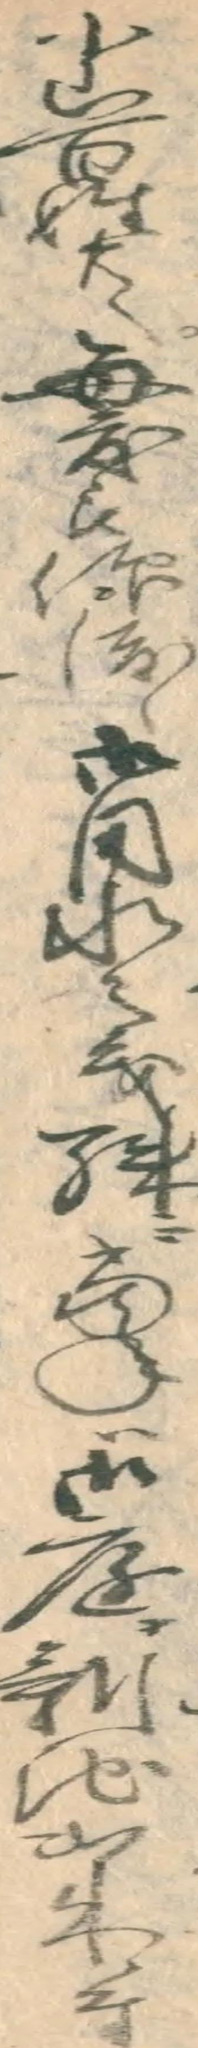小山百姓共へ毎度被仰渡候御用水之義殊ニ当年ハ御庭ニ新池出来ニ付
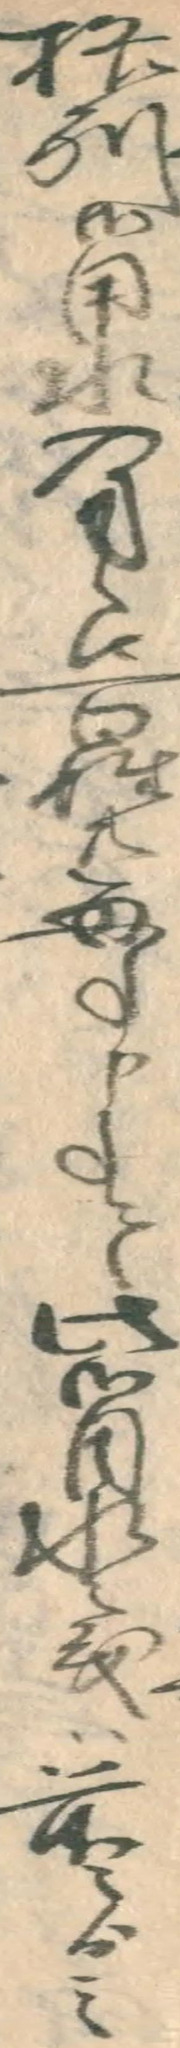格別御用水入用之由百姓共毎事申事ニ候此御用水之義ハ前々ゟ之
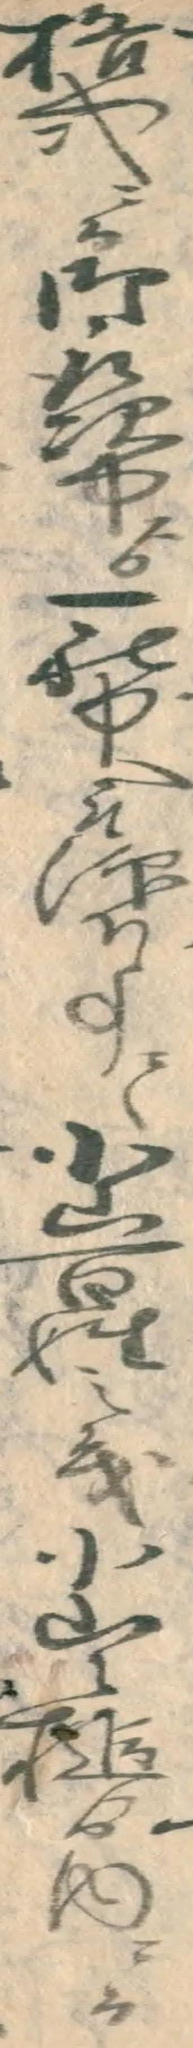格式ニ而御取次中ゟ一社中へ被仰下候事ニ候小山百姓之義小山之槌ゟ内ニ而
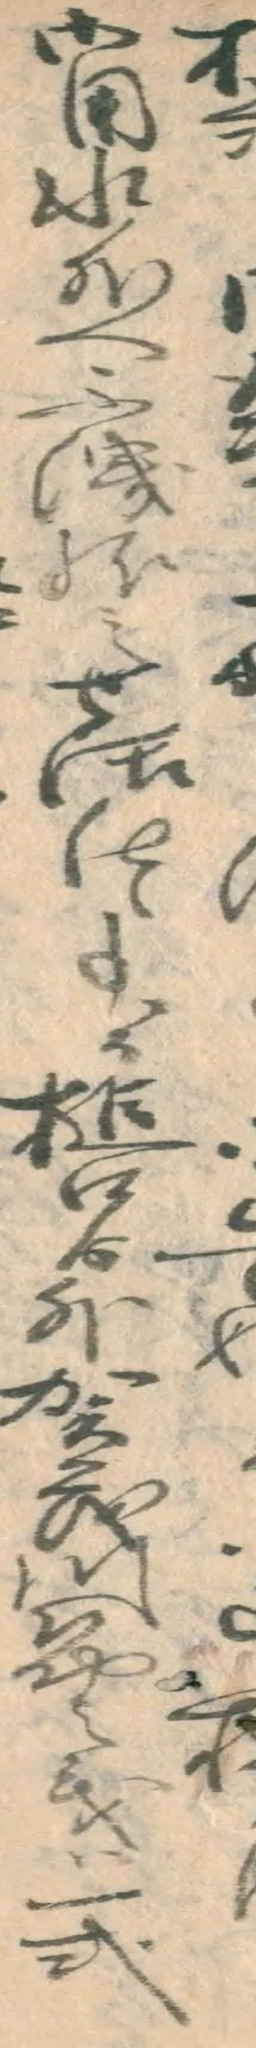御用水外へ不洩様之世話仕候事ニ而槌口ゟ外賀茂川筋之義ハ一式
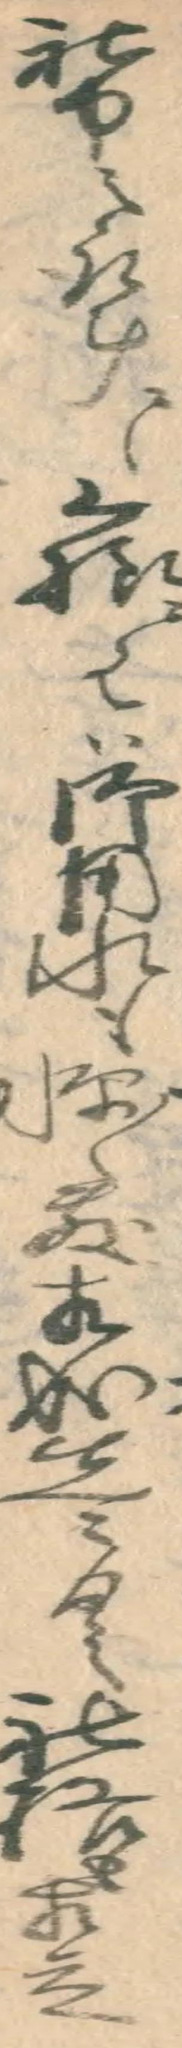社中之取計ニ候ケ様ニ候てハ御用水も軽〳〵敷相成先々ゟ之社格も相立
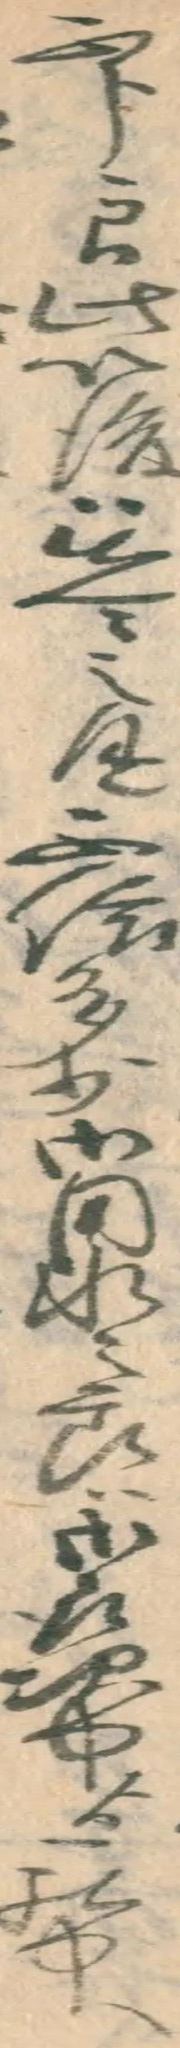不申候間此以後ハ先々之通不依多少御用水之節ハ御取次中ゟ一社中へ
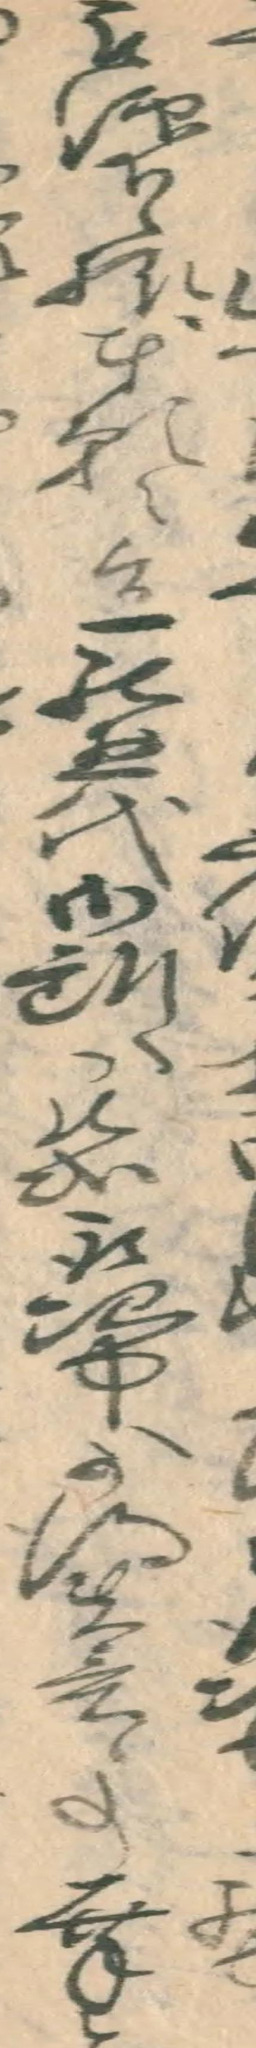被仰下候様ニ奉願之旨一社惣代御所へ罷出取次中へ可得貴意候事幸と
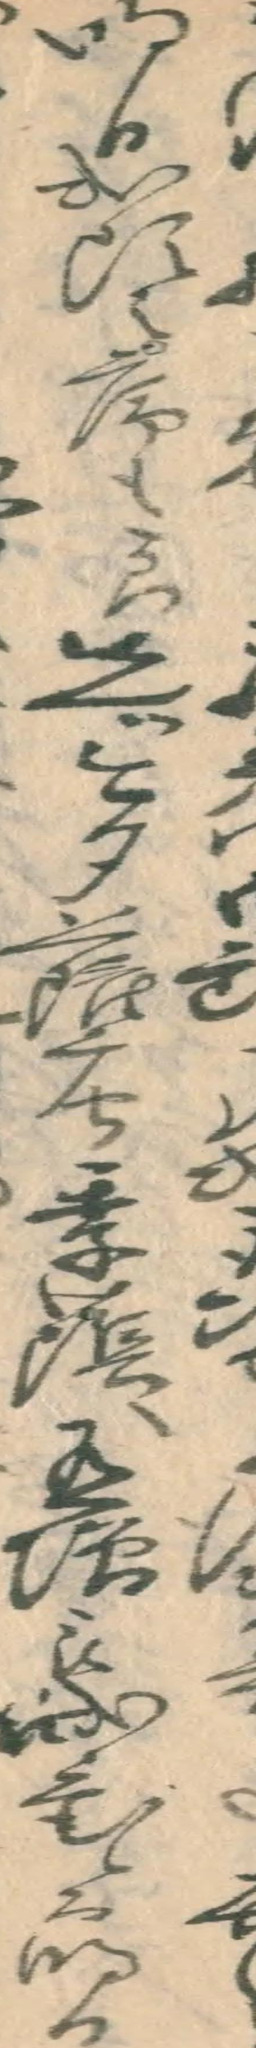明日出頭之序も候間先ツ今夕薩摩季蔭へ有増被咄置候而明日
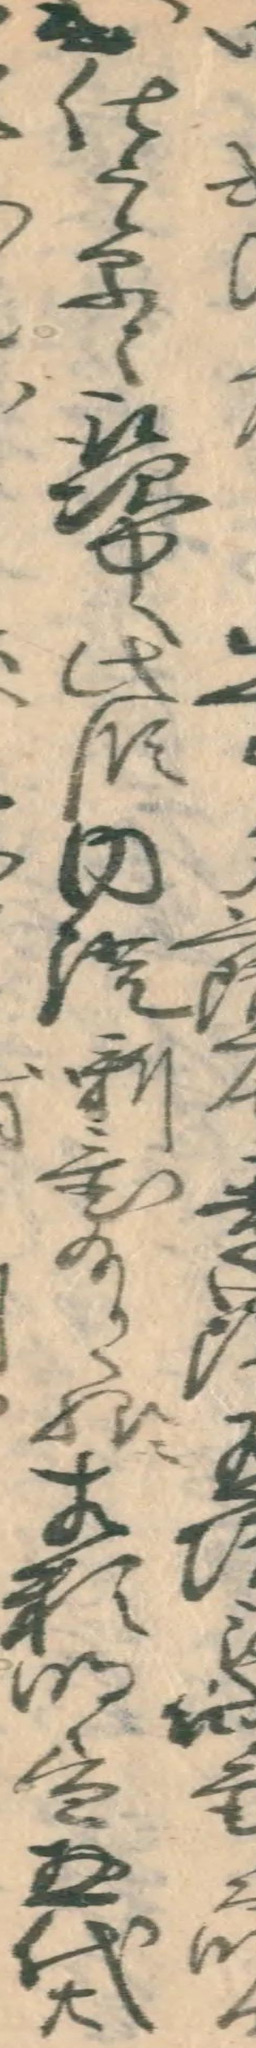出仕候ハヽ早々取次中へ此段内証噺置玉り候様ニ相頼明昼惣代共
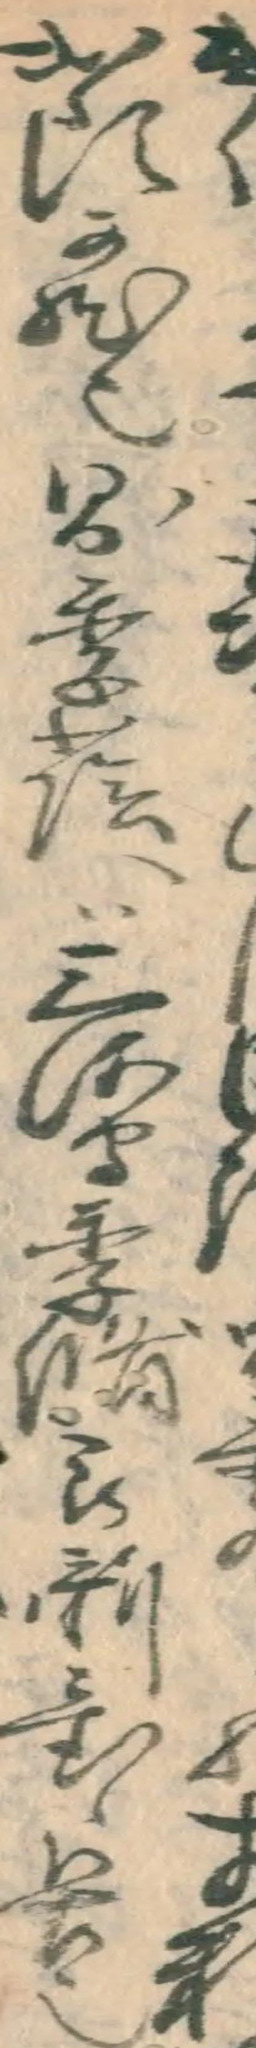出頭可然也則季蔭へは三河守季脩被噺置候筈也
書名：賀茂社記録. 第58冊
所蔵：国立国会図書館 National Diet Library, JAPAN
